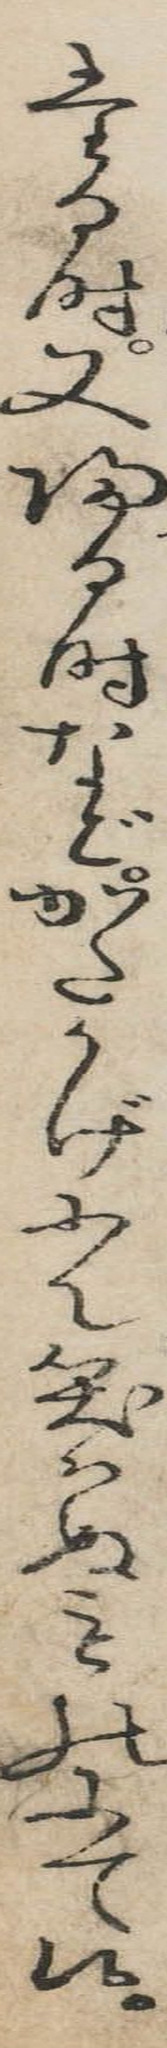たる時又帰る時など。かたかげにて笑はぬものにて候。

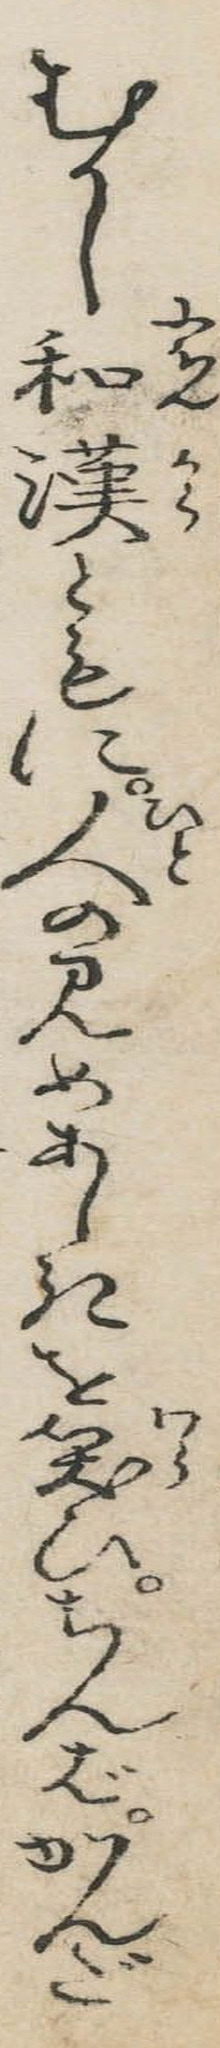むかし和漢ともに。人の見めあしきを笑ひ。ちんば。かんだ
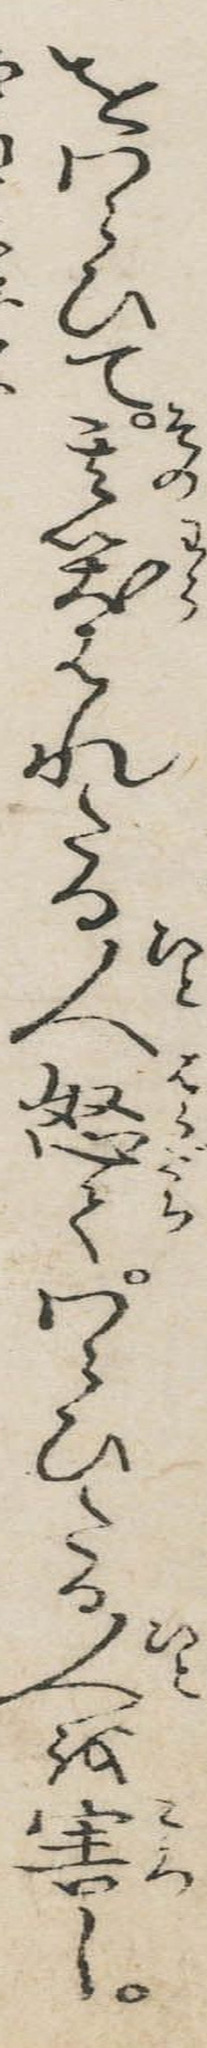をわらひて。其笑はれたる人怒て。わらひたる人を害し。
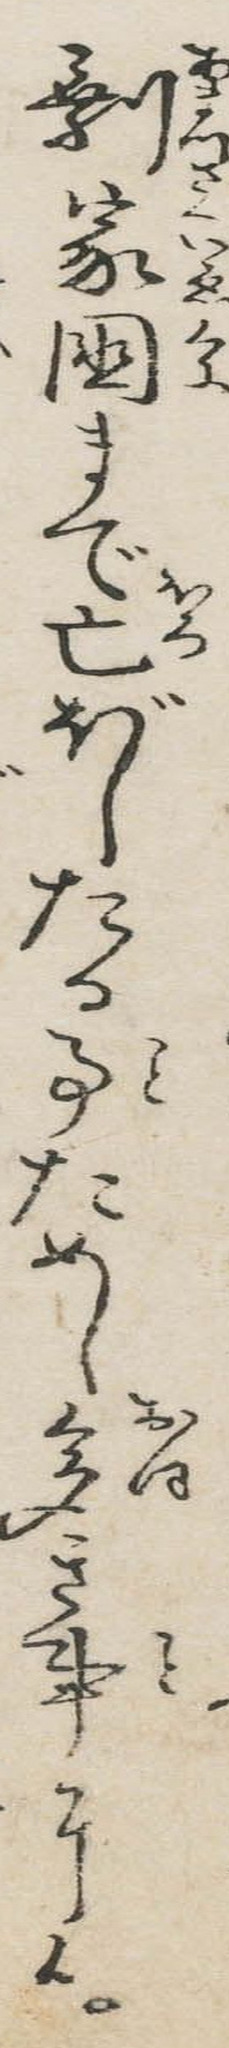剰家国まで亡ぼしたる事ためし多き事に候。
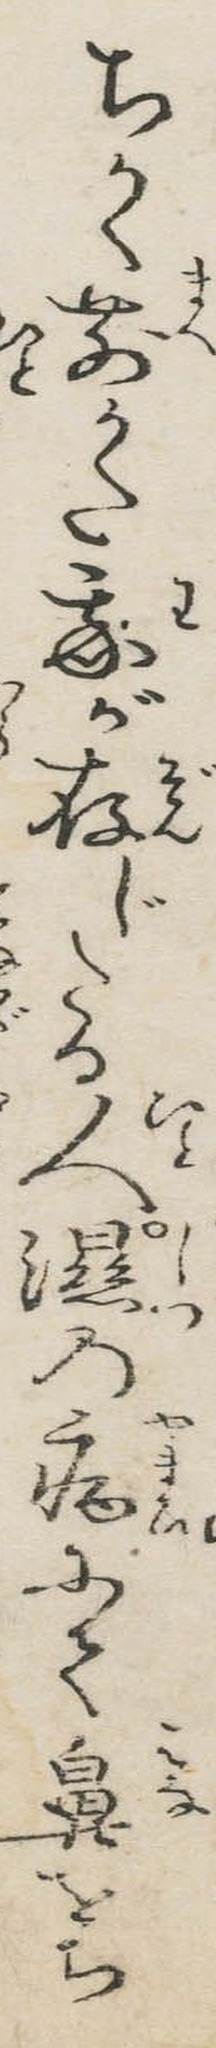ちかく前かた我が存じたる人。濕の病にて鼻をち
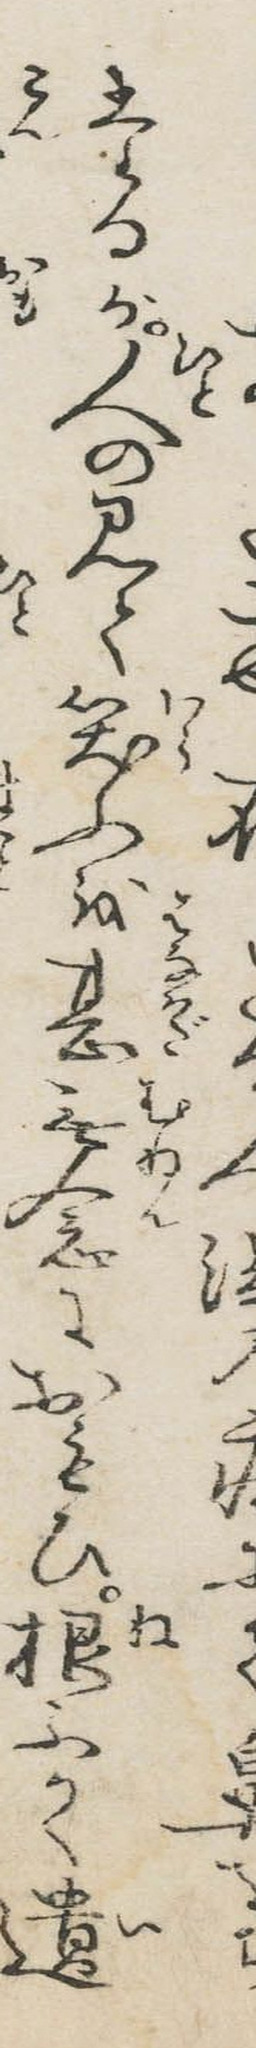たるに。人の見て笑ふを甚無念におもひ。根ふかく遺
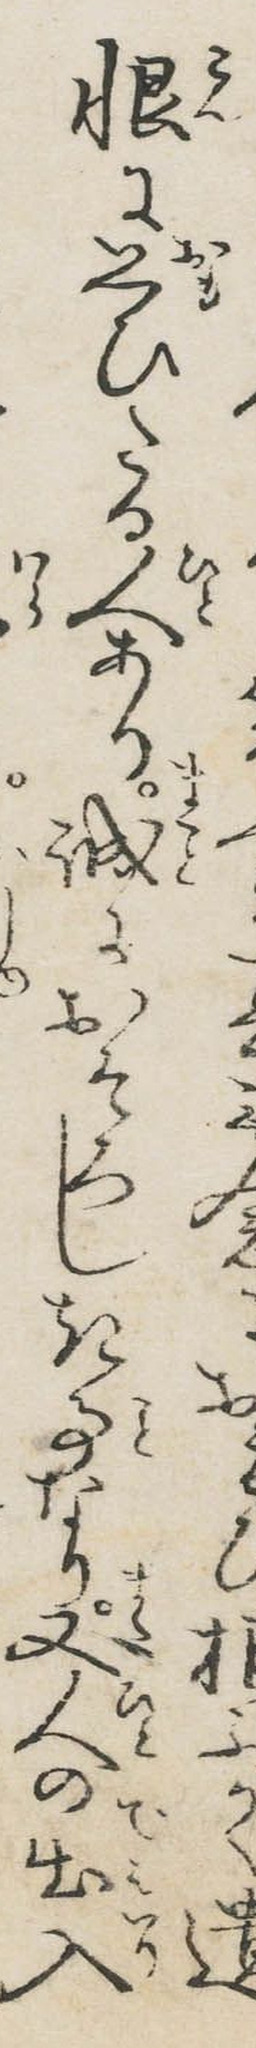恨に思ひたる人あり。誠におそろしき事なり。又人の出入
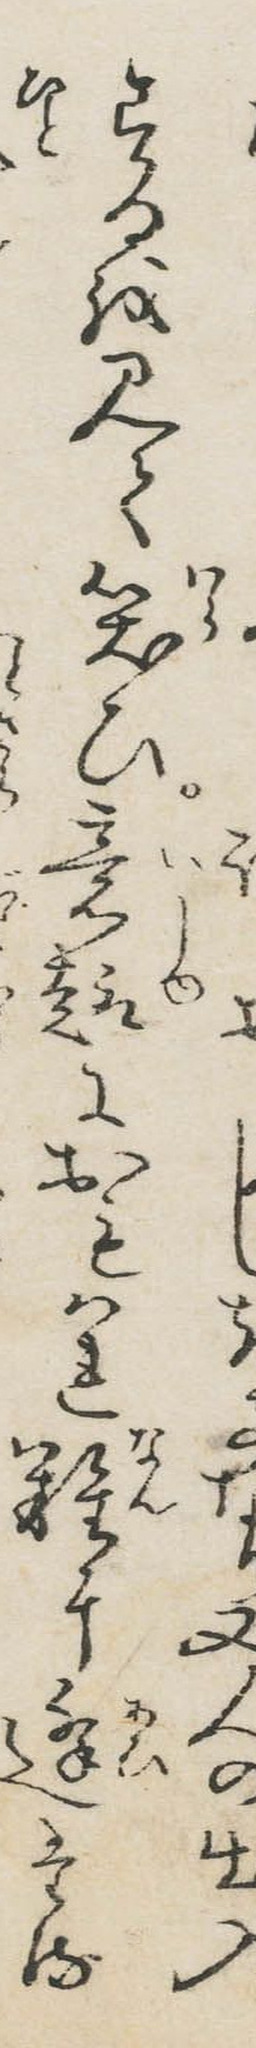するを見て笑ひ。意趣におもはれ難に逢たる
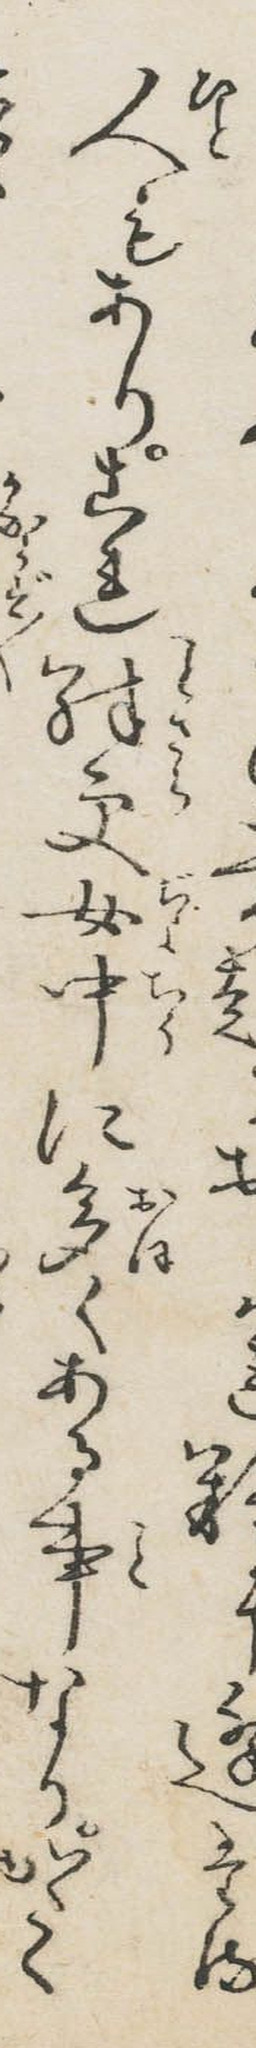人もあり。これ殊更女中に多くある事なり。かたく
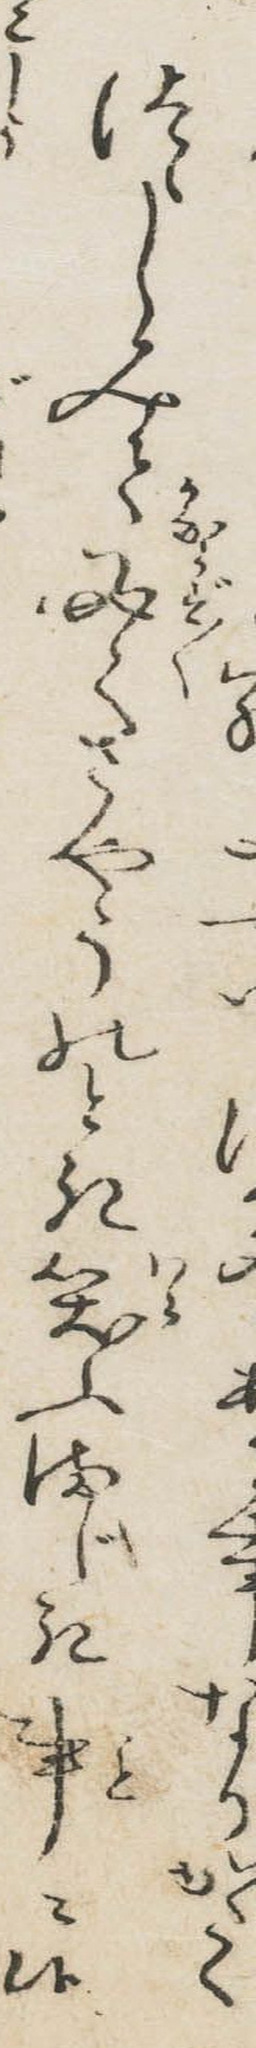つゝしみて必〳〵さやうのとき笑ふまじき事に候
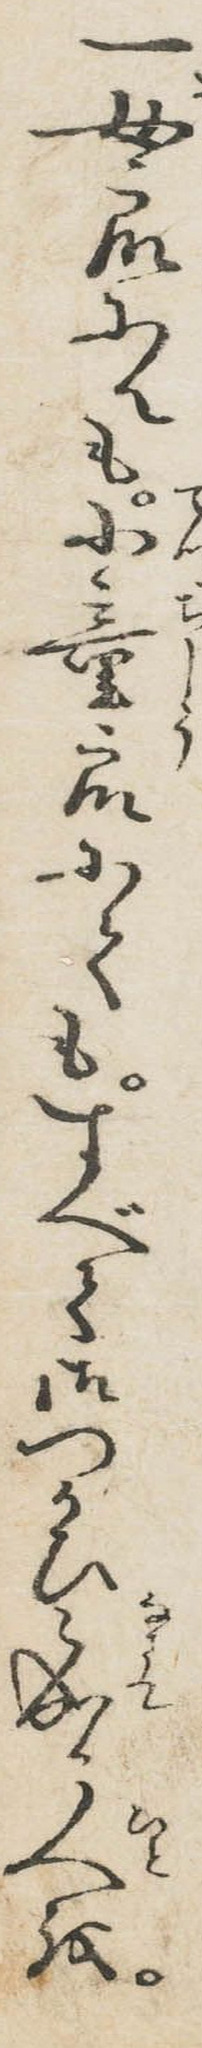一女衆にても。小童衆にても。すべて御つかひ被成候人を。
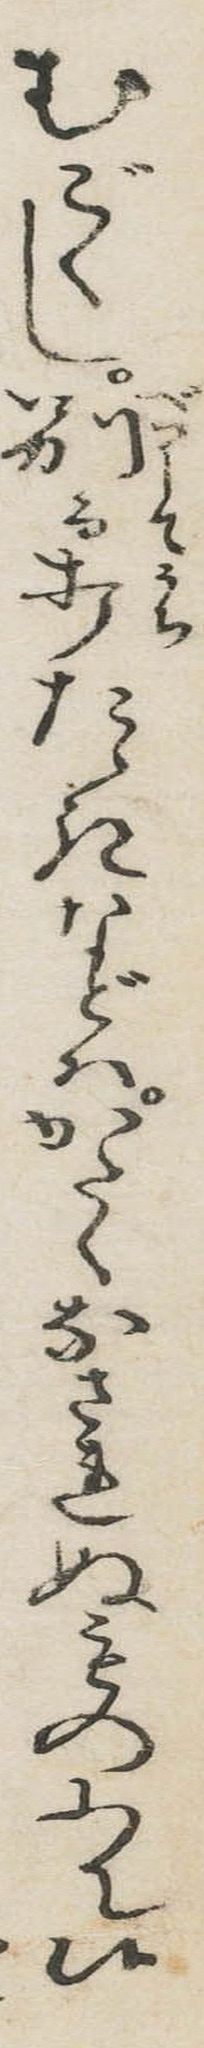むごくし。別而打たゝきなどは。かたくなされぬものにて候
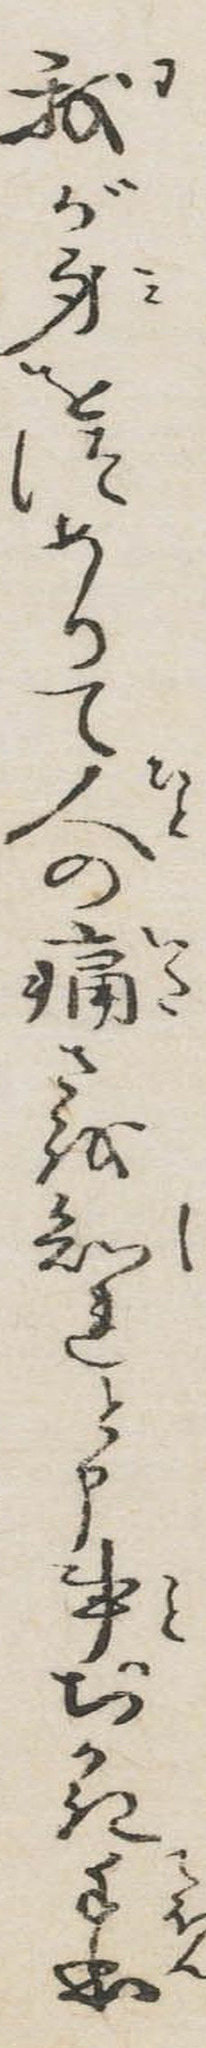我が身をつめりて人の痛さを知れと申事。ちかき手本
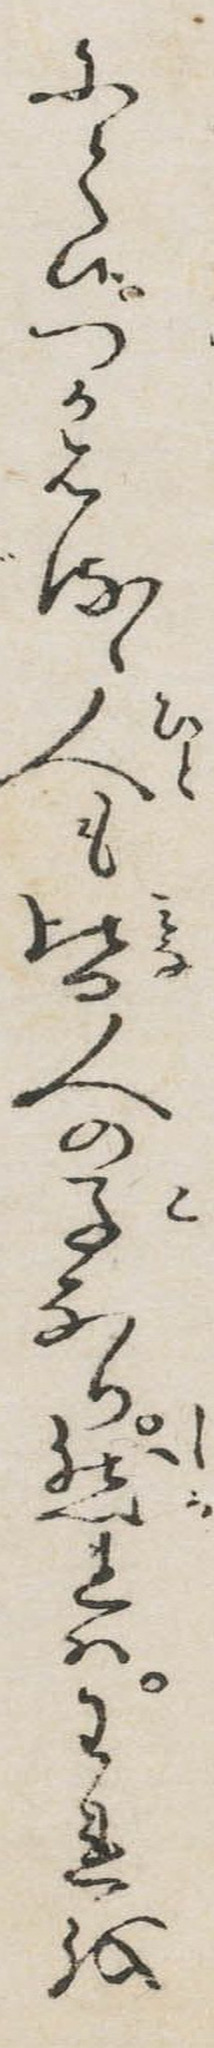にて候。つかはるゝ人も皆人の子なり。然れは。われを
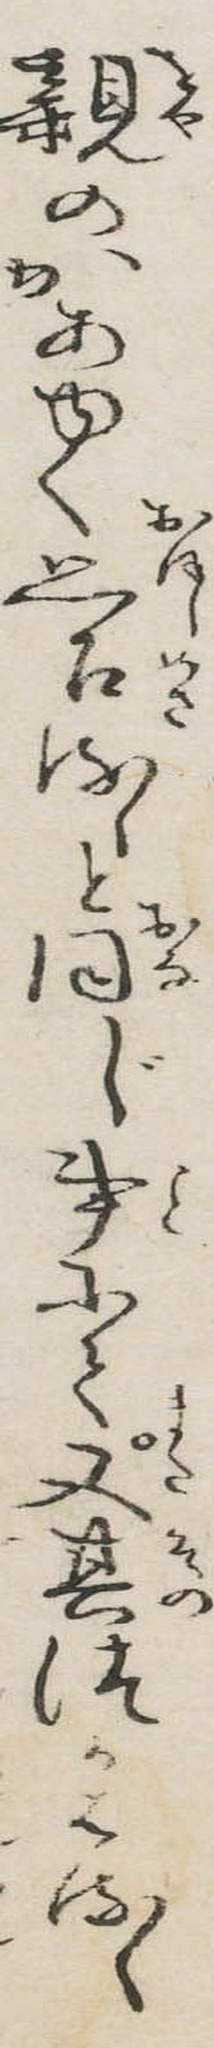親のかあゆく思召るゝと同じ事にて。又其つかはるゝ
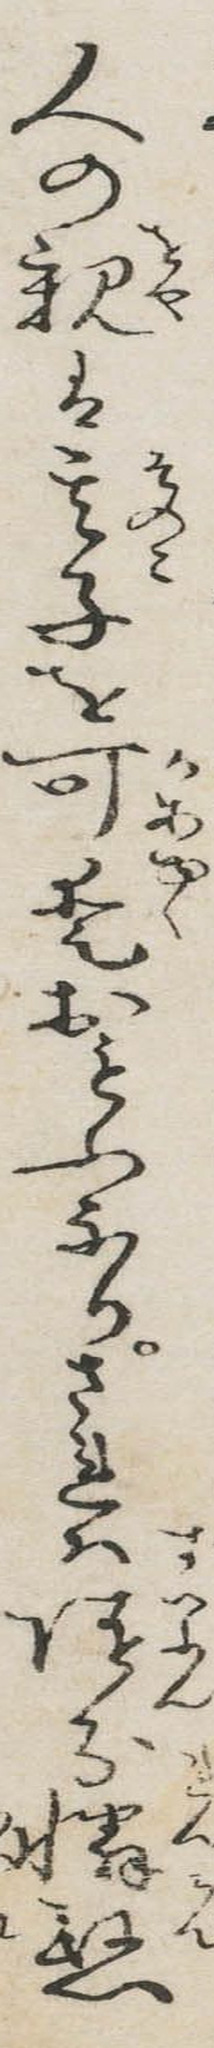人の親は其子を可愛おもふなり。されは随分憐愍
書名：前訓
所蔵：東京学芸大学附属図書館
